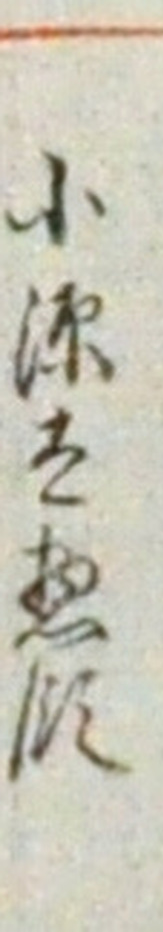小源太惣領
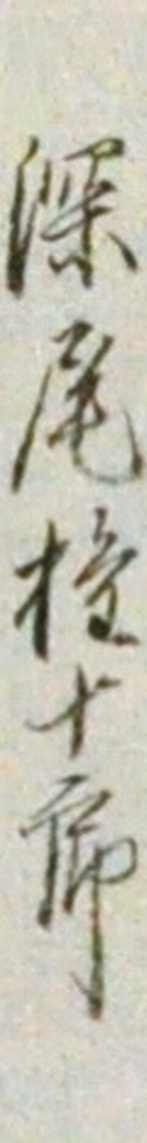深尾権十郎
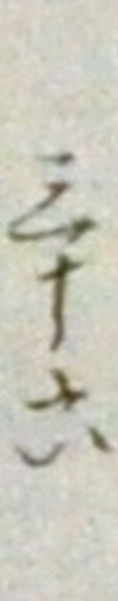三十六
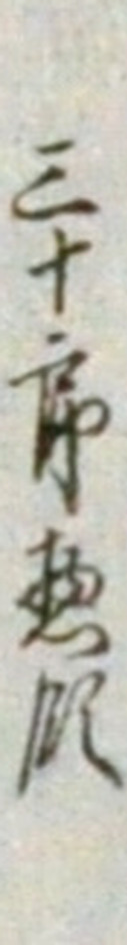三十郎惣領
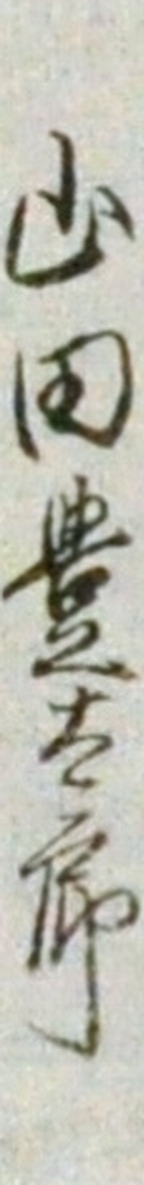山田豊太郎
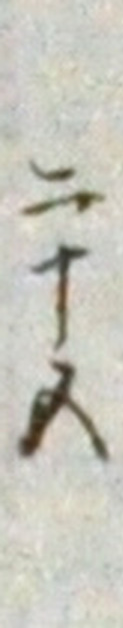二十五
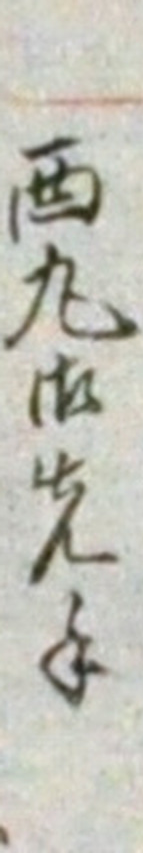西丸御先手
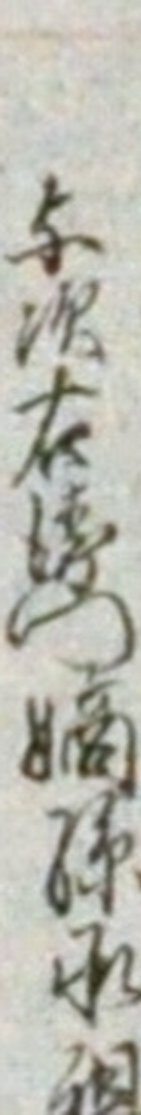与次右衛門嫡孫承祖
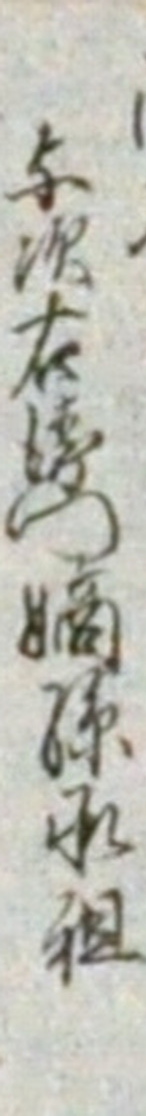与次右衛門嫡孫承祖
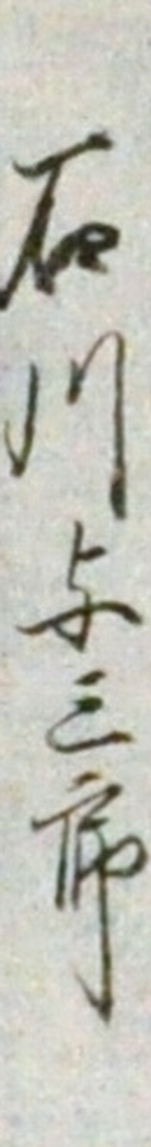石川与三郎
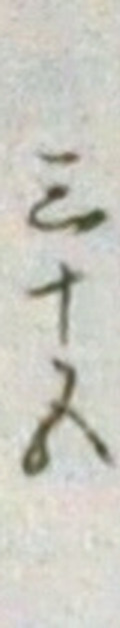三十五
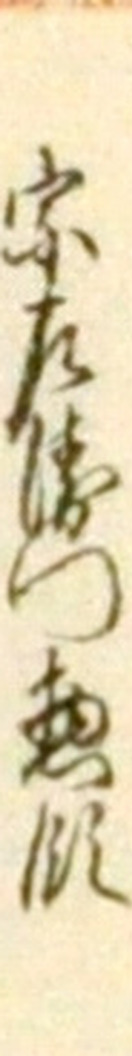宗左衛門惣領
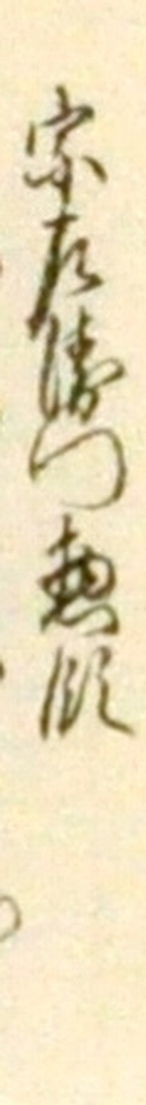宗左衛門惣領
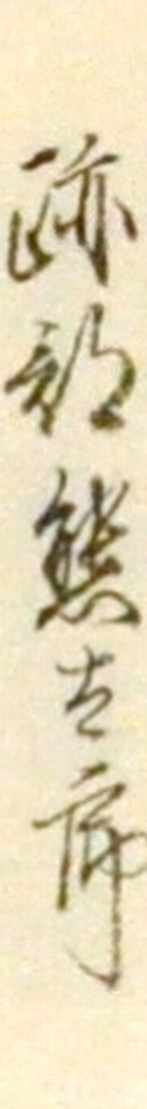跡部熊太郎

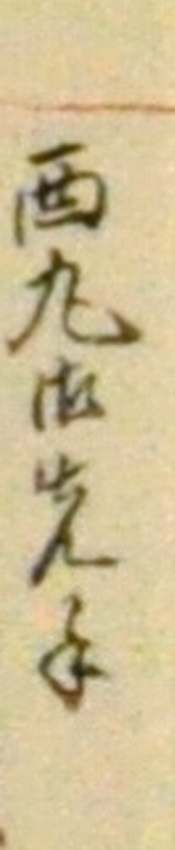西丸御先手
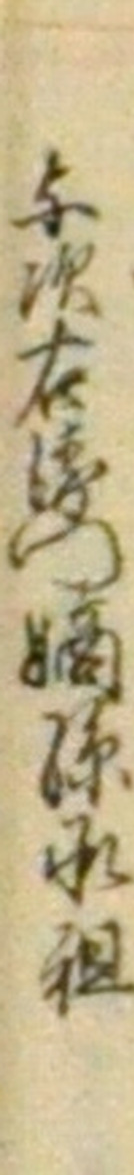与次右衛門嫡孫承祖
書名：若年寄御役中之御書物〔一括〕
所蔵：伊那市立高遠町図書館・合同会社AMANE
